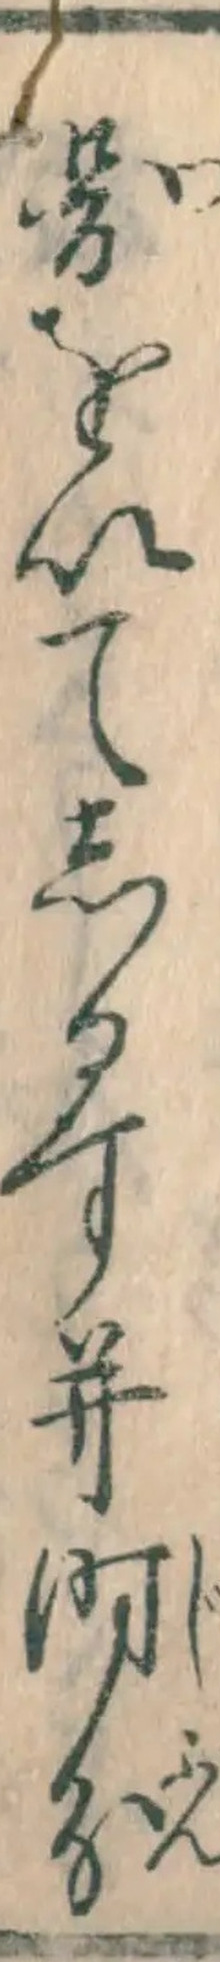図を以てしるす并時分
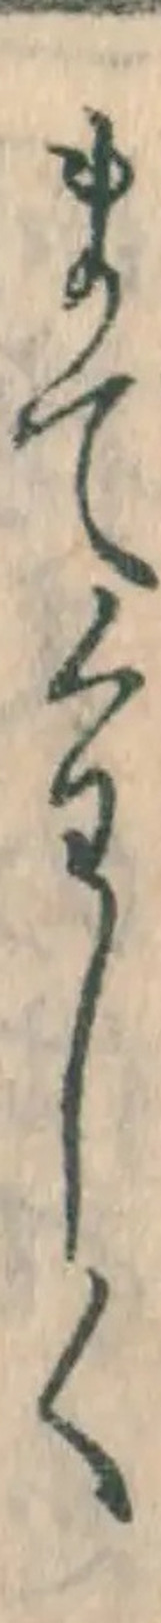までくわしく

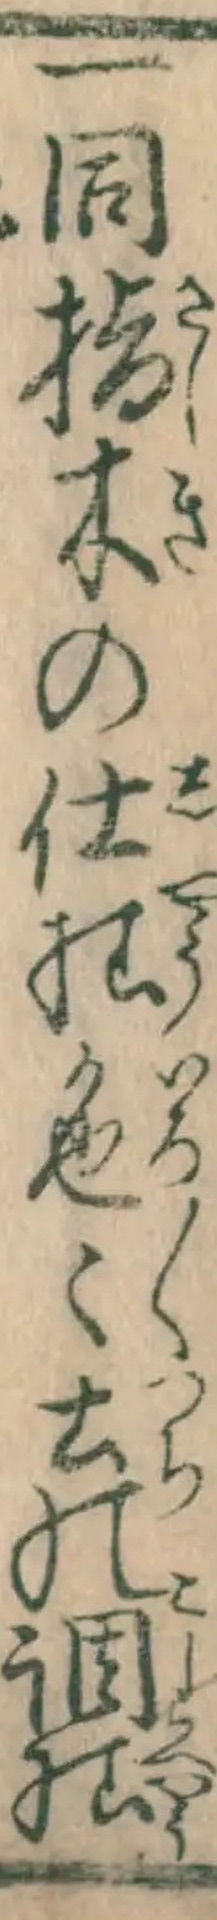一同指木の仕様色々土の調様
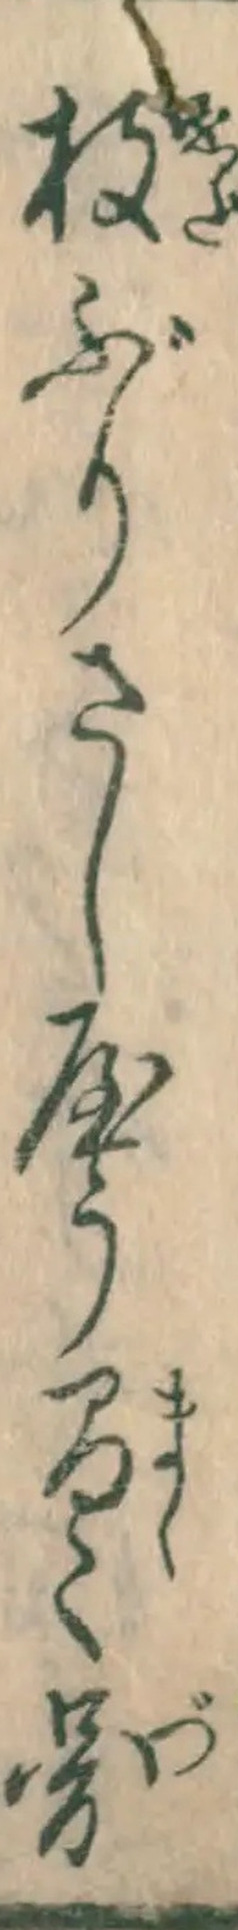枝ぶりさしやう間々図
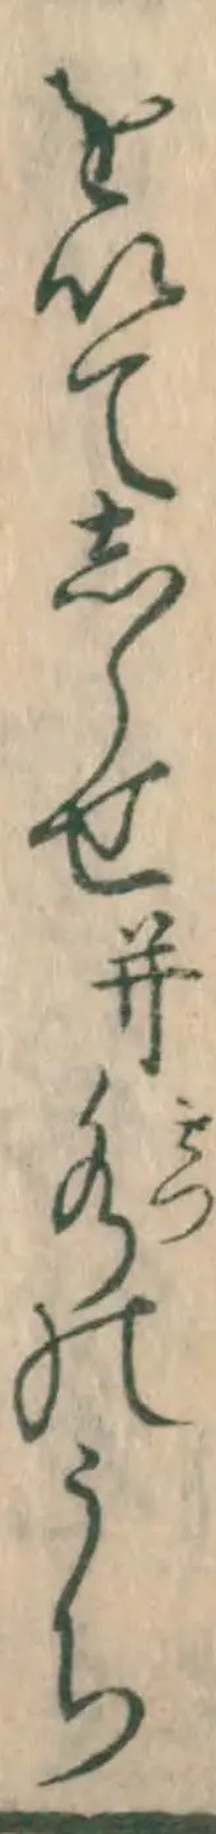を以てしらせ并水のうち
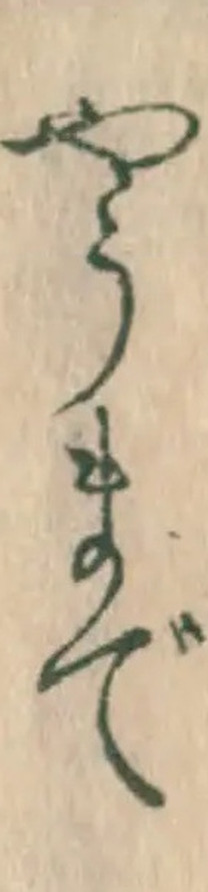やうまで
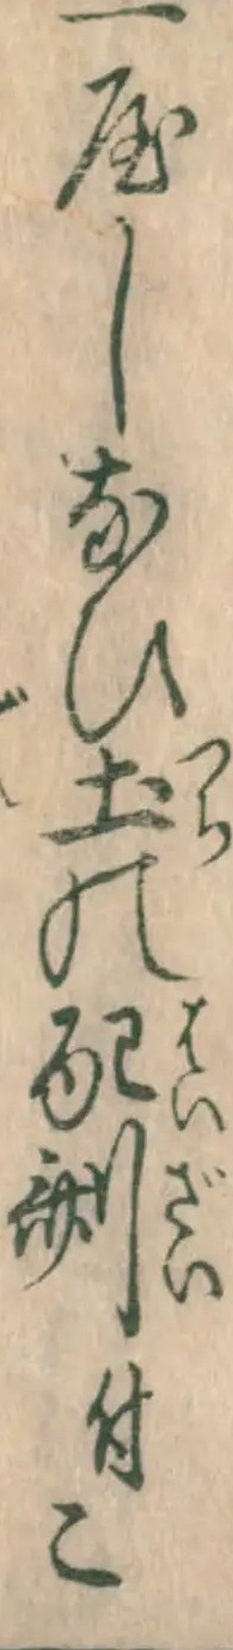一やしなひ土の配剤付こ
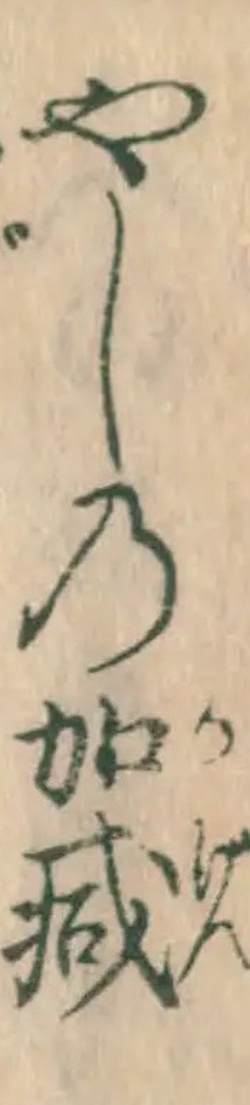やしの加減
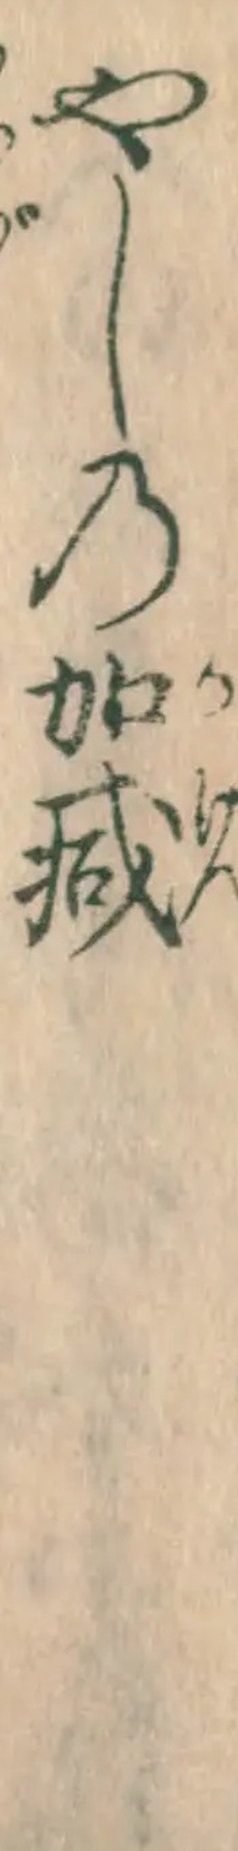やしの加減
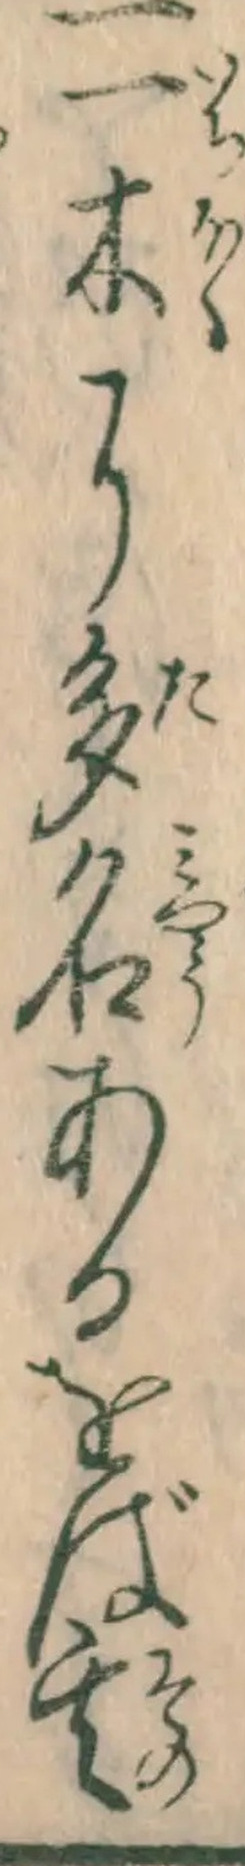一一木に多名あるをば其
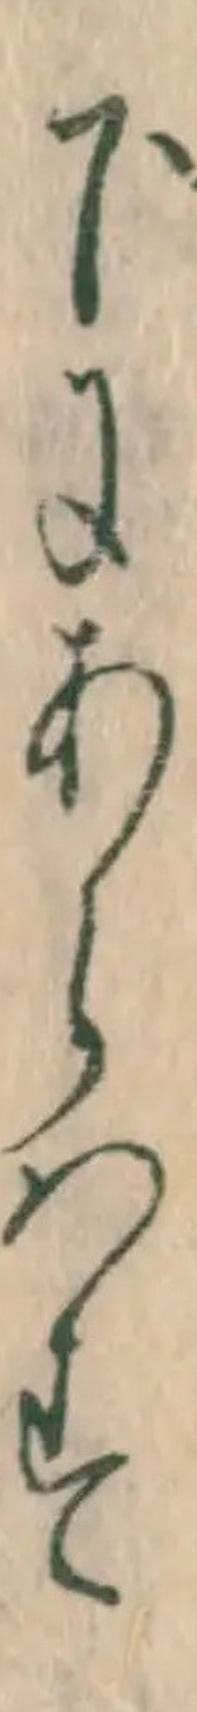下にあらはす
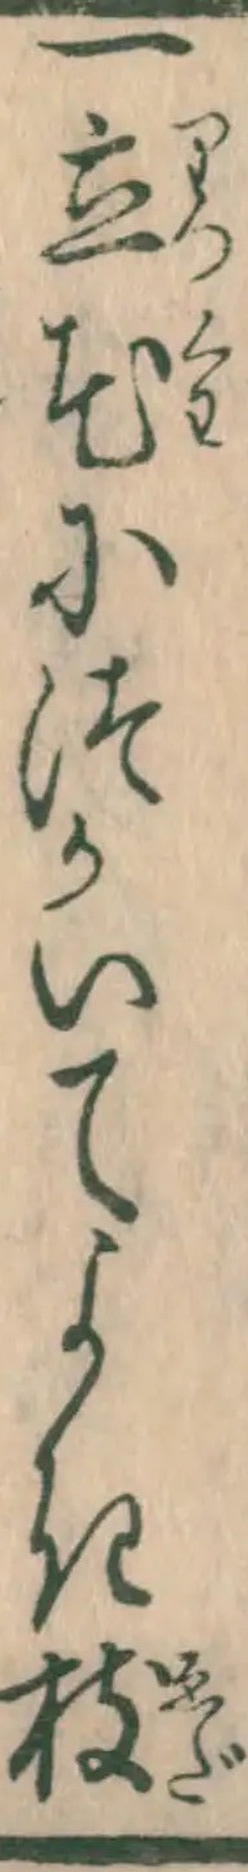一立花につかいてよき枝
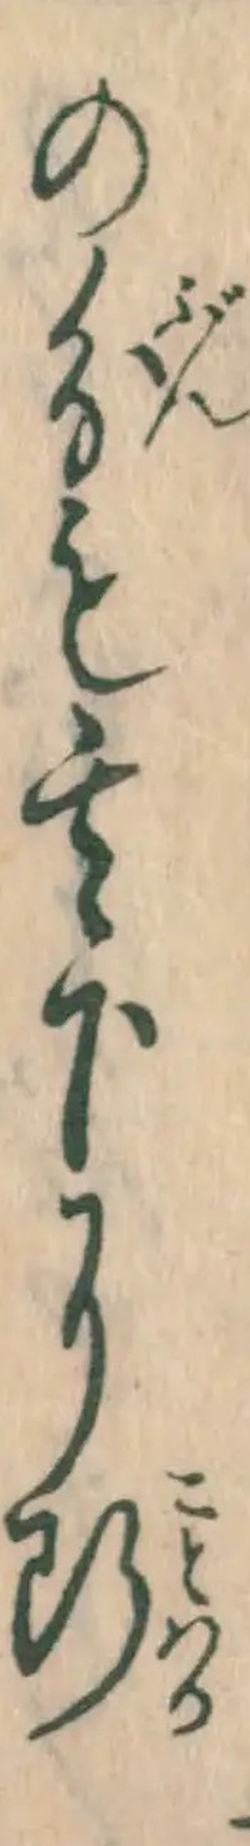の分を其下に断
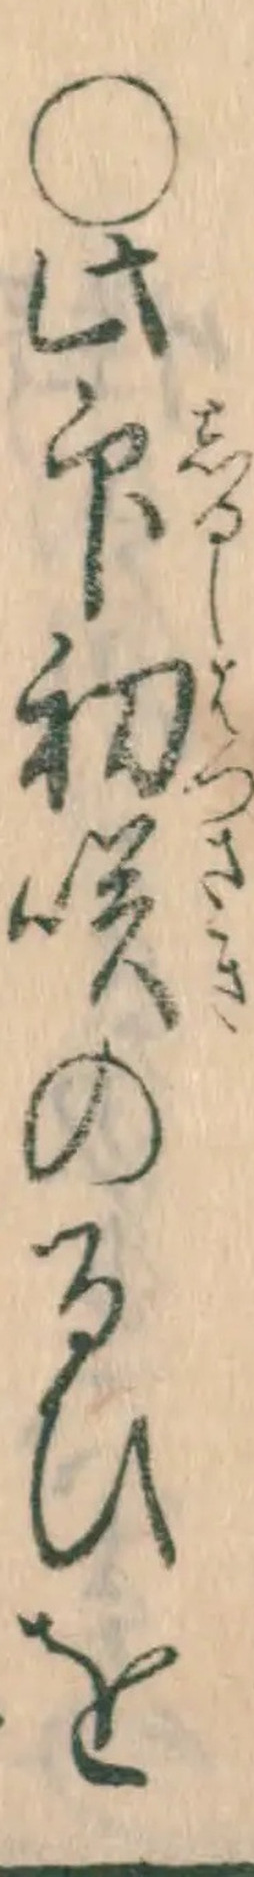○此印初咲のるひを
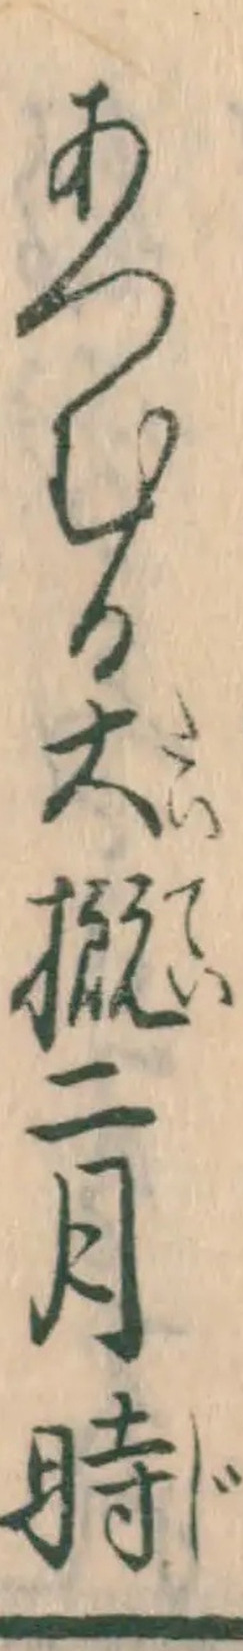あつむる大概二月時
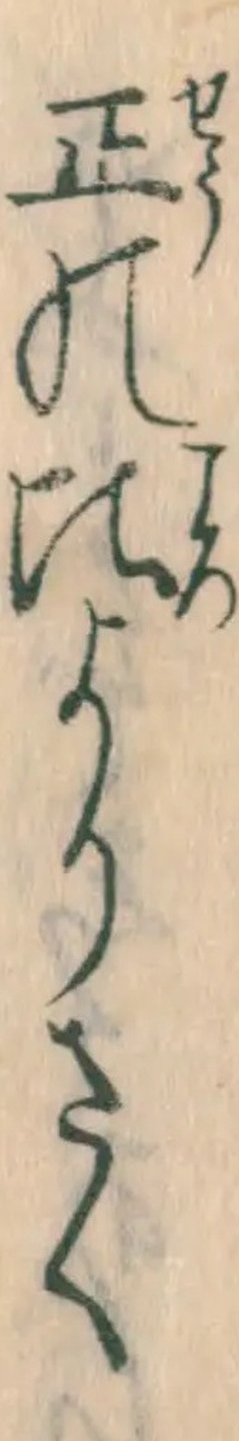正の頃よりさく
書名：錦繍枕 5巻. [1]
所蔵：国立国会図書館 National Diet Library, JAPAN
